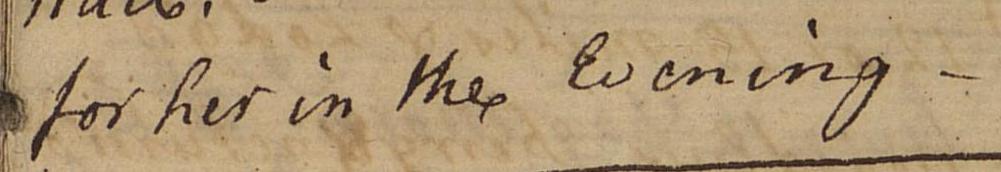for her in the Evening-
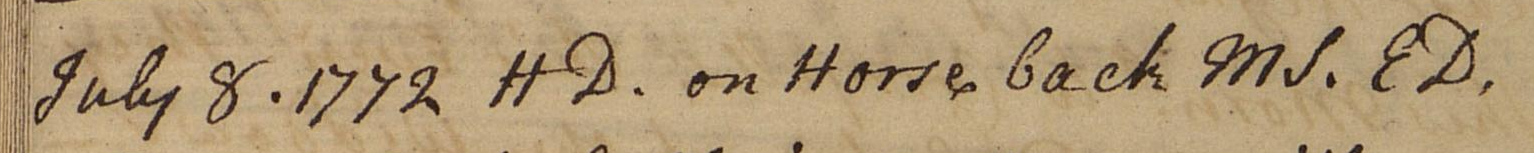July 8. 1772 HD. on Horse back MS. ED.
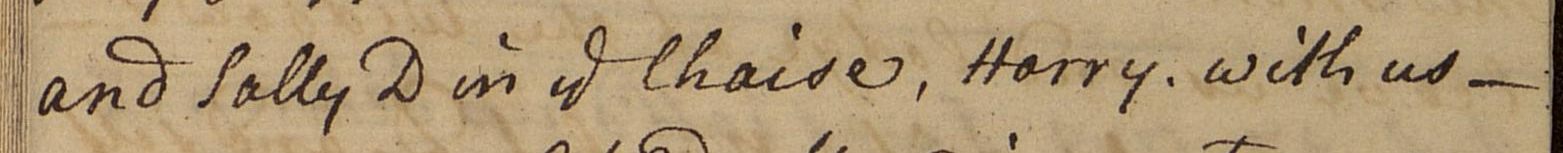and Sally D in y^e Chaise, Harry with us-
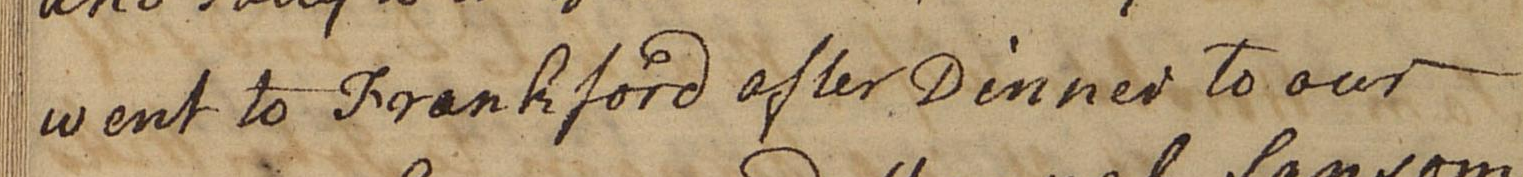went to Frankford after Dinner to our
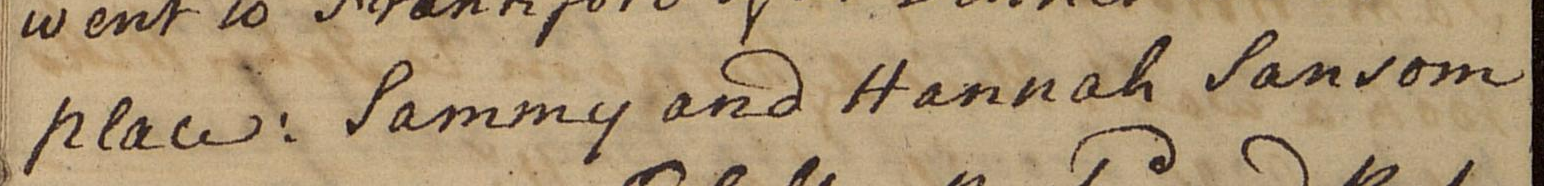place: Sammy and Hannah Sansom
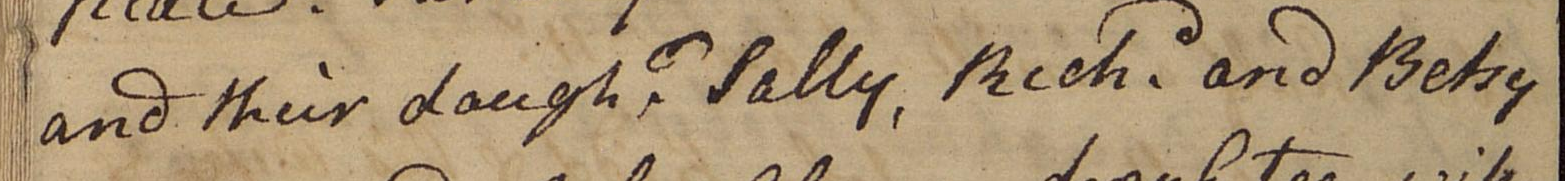and their daugh^r, Sally, Rich^d. and Betsy
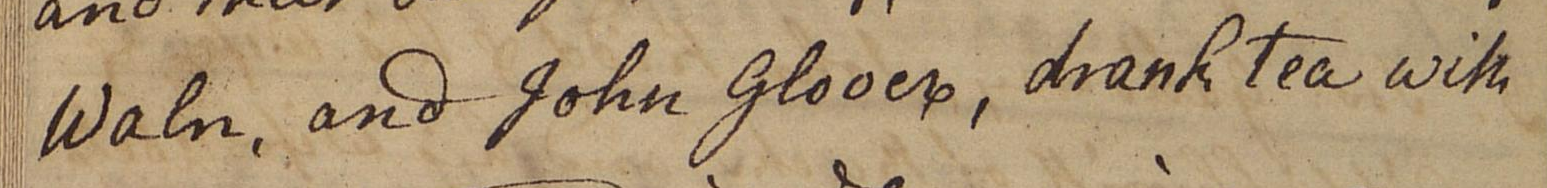Waln, and John Glover, drank tea with
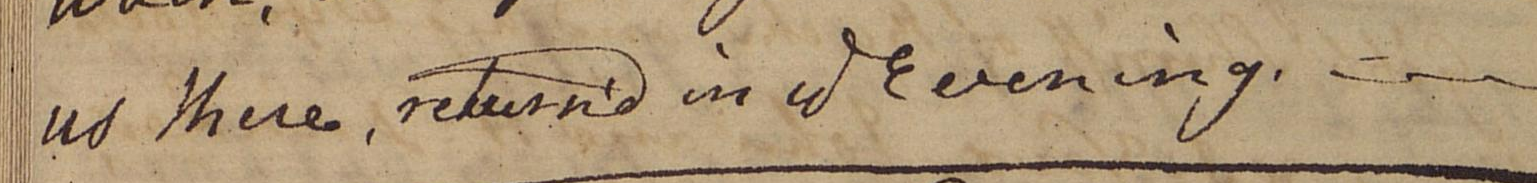us there, return'd in y^e Evening.-
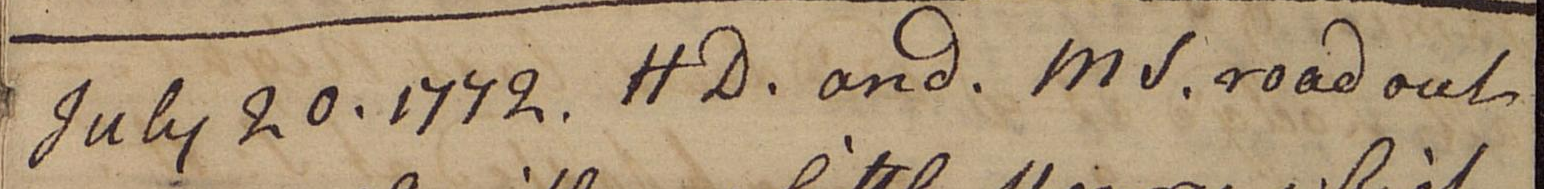July 20. 1772. HD. and. MS. road out
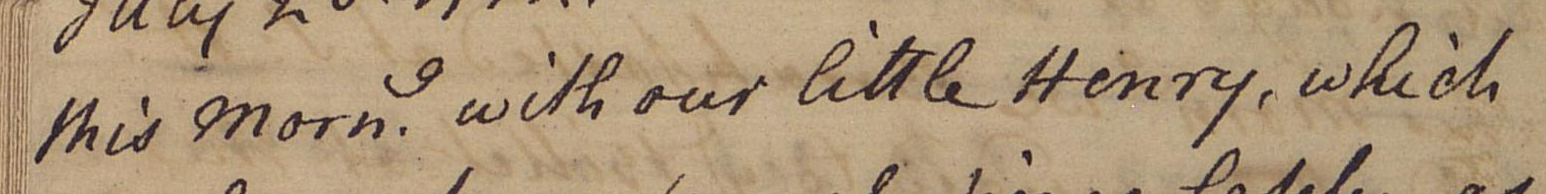this morn^g. with our little Henry, which
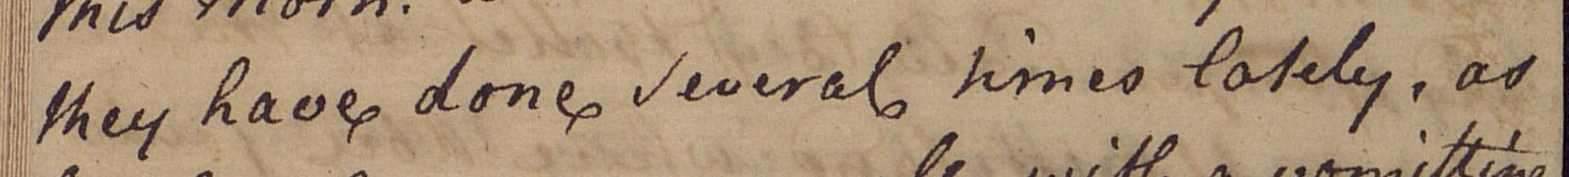they have done several times lately, as
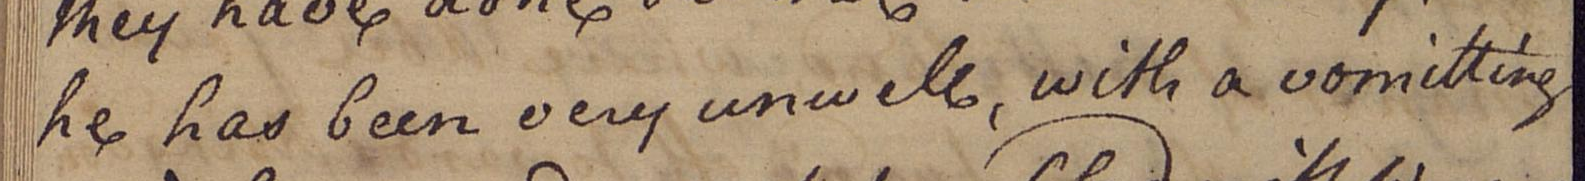he has been very unwell, with a vomitting
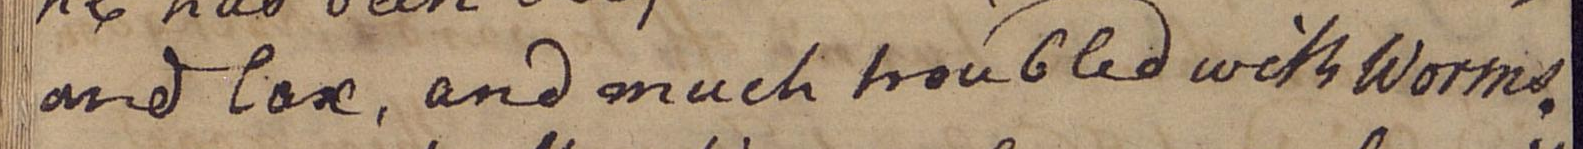and lax, and much troubled with Worms
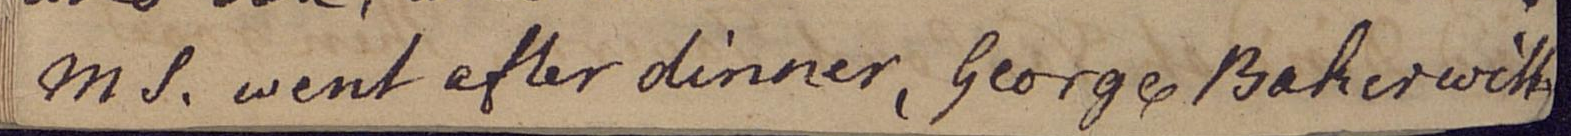MS. went after dinner, George Baker with
